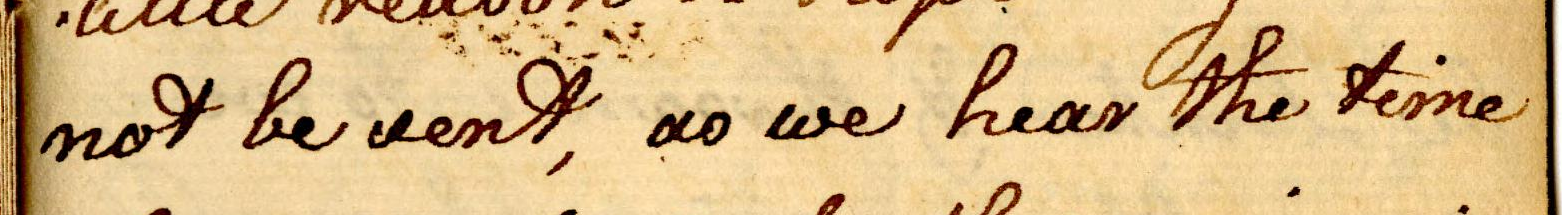not be sent, as we hear the time
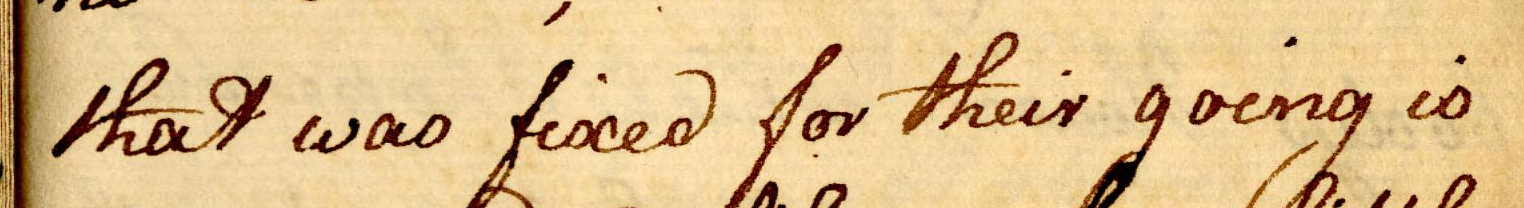that was fixed for their going is
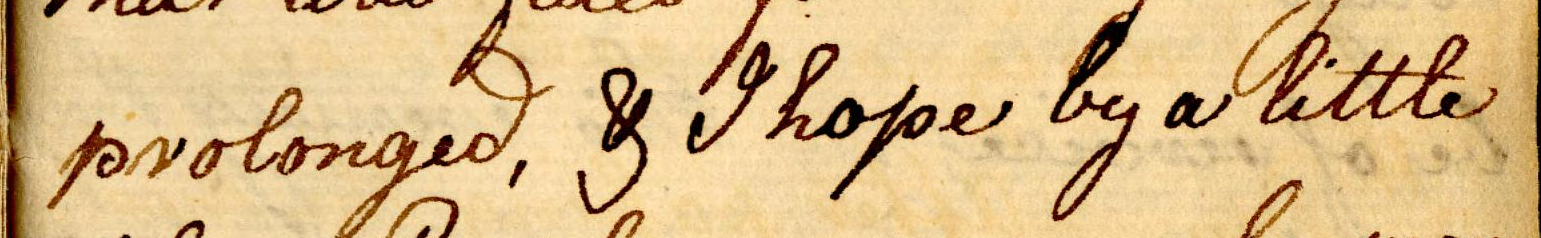prolonged, & I hope by a little
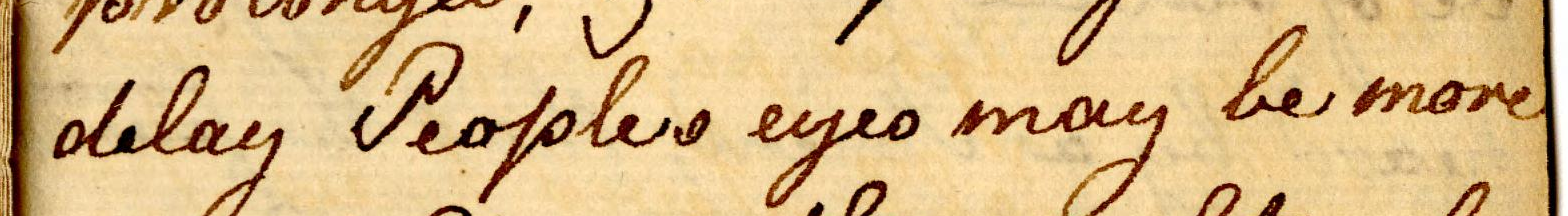delay Peoples eyes may be more
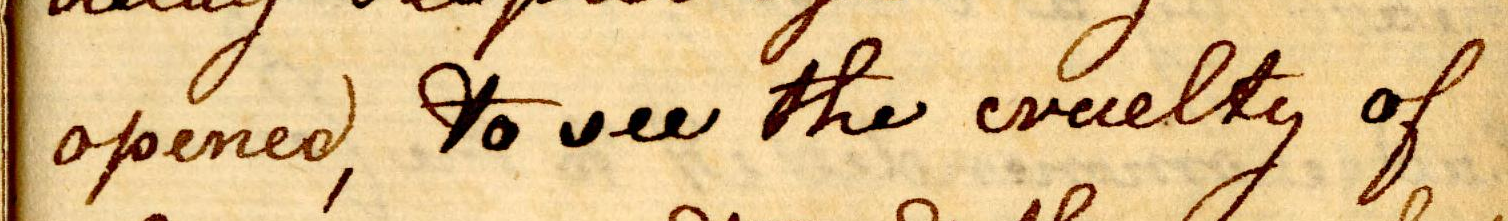opened, to see the cruelty of
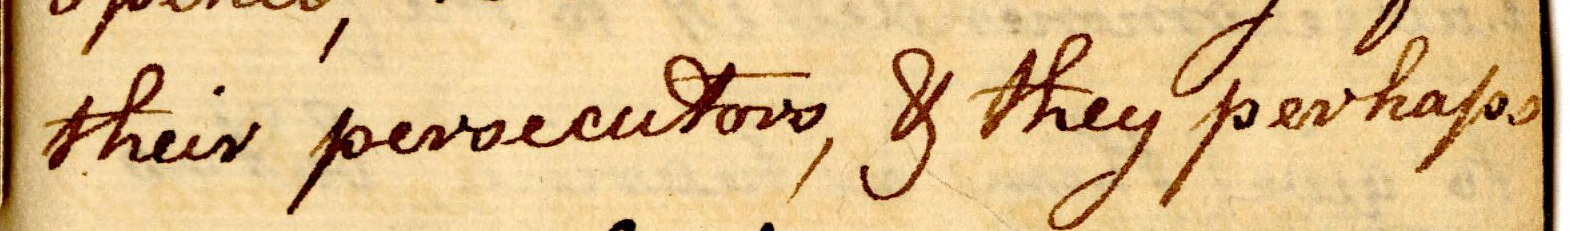their persecutors, & they perhaps
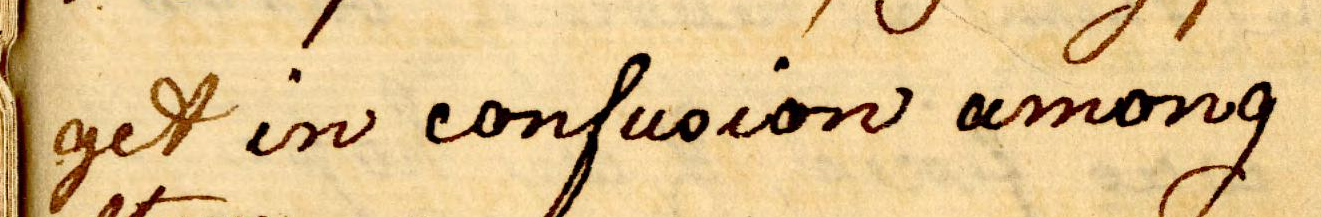get in confusion among
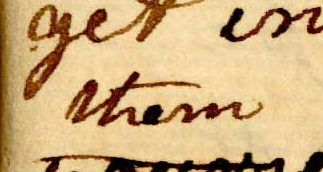them
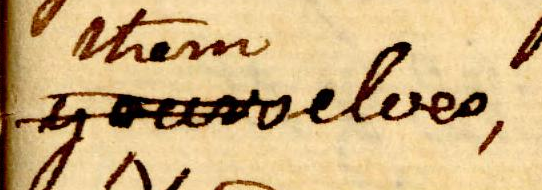^ [your]selves
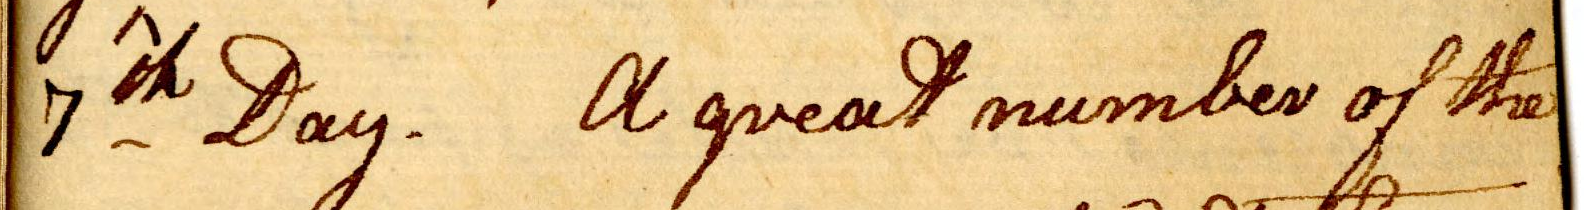7^th Day. A great number of the
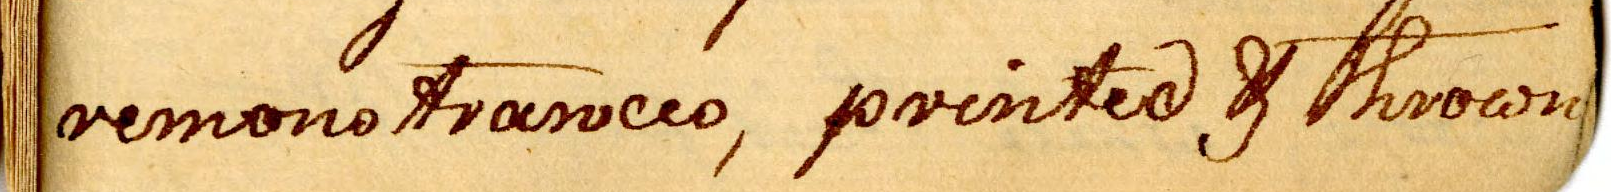remonstrances, printed & thrown
